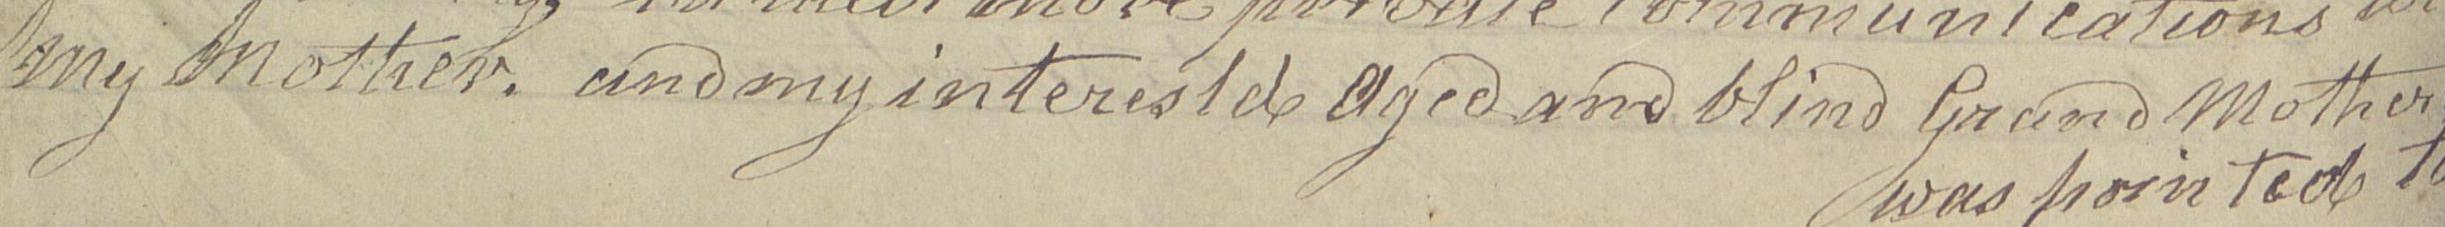my Mother. and my interestd aged and blind Grand Mother;
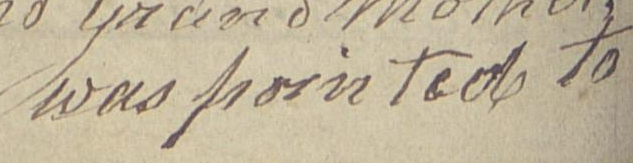was pointed to
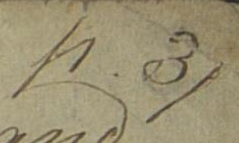p. 3
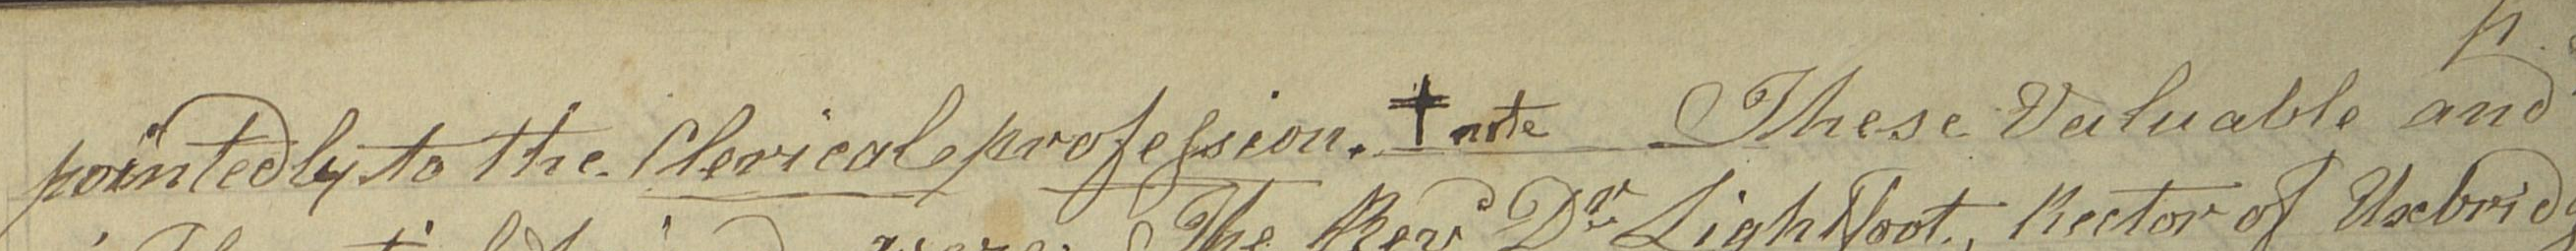pointedly to the clerical profession. + note These valuable and
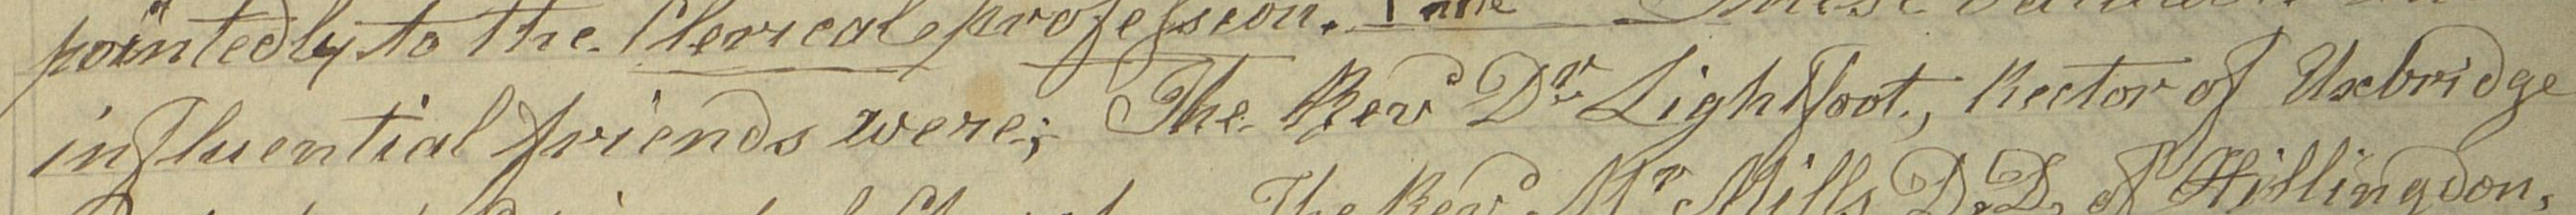influential friends were; The Rev^d D^r. Lightfoot, Rector of Uxbridge
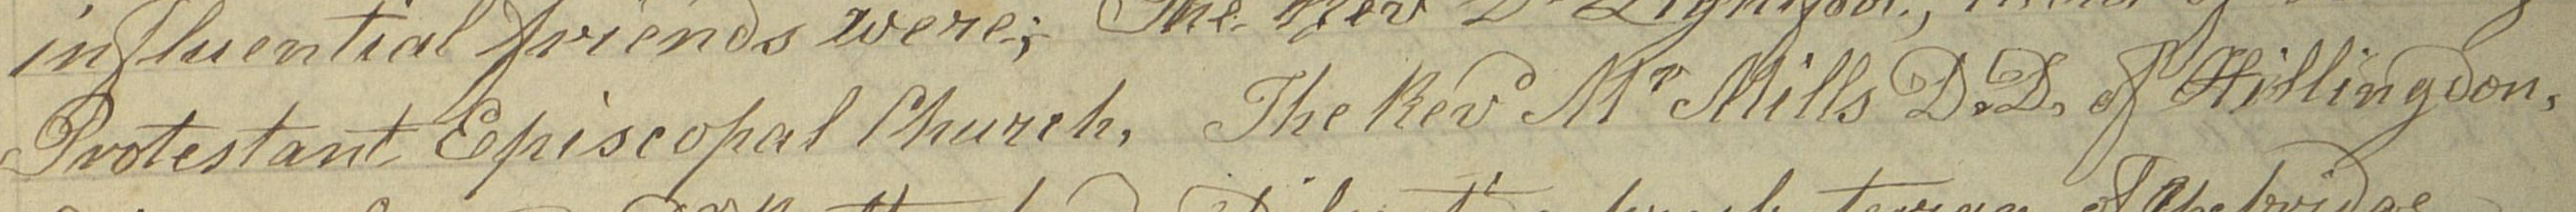Protestant Episcopal Church, The Rev^d M^r Mills D. D. of Hillingdon,
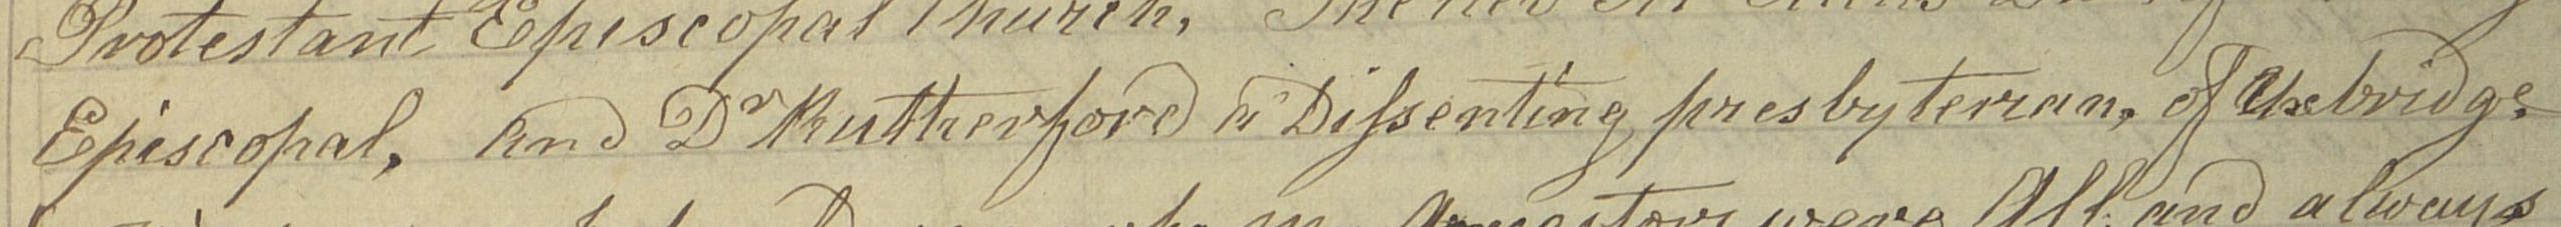Episcopal, and D^r. Rutherford a Dissenting presbyteran of Uxbridge.
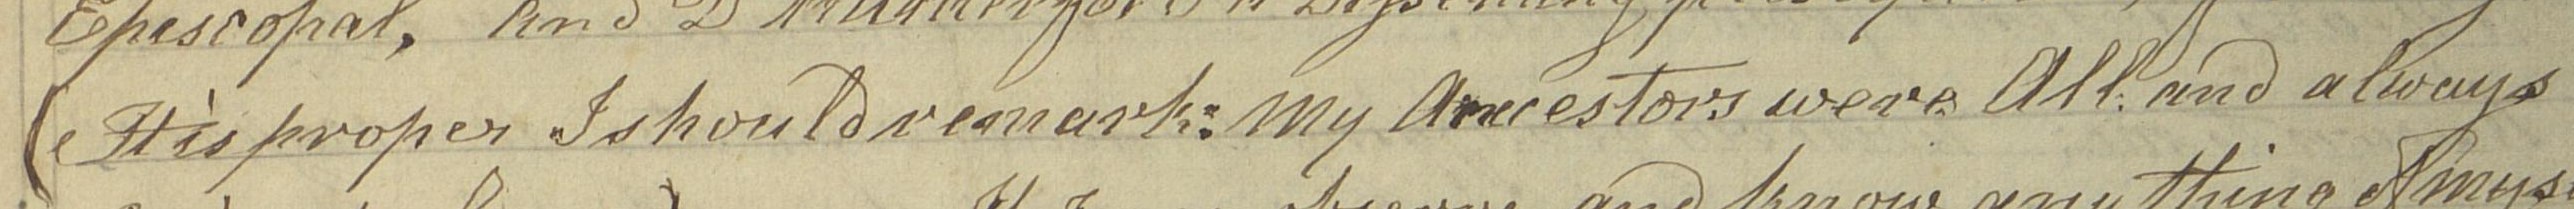(It is proper I should remark: My Ancestors were All and always
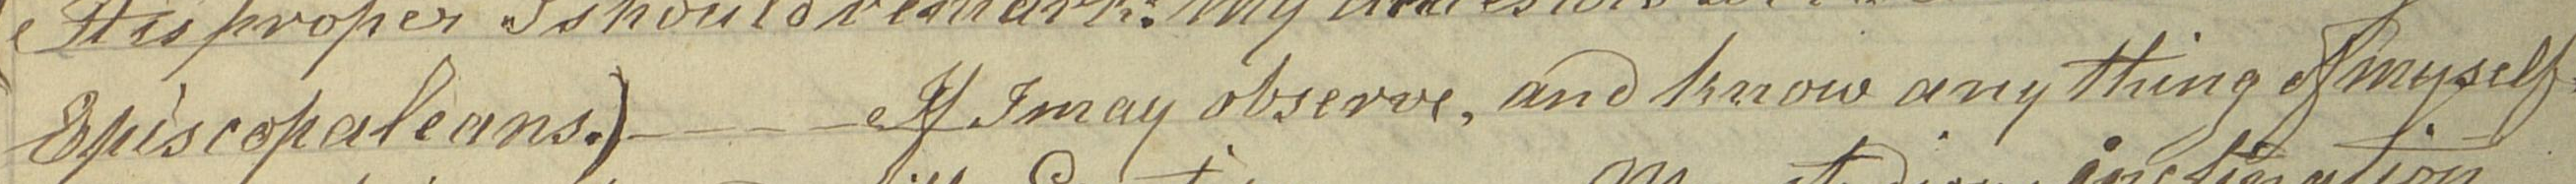Episcopaleans.) If I may observe, and know any thing of myself,
